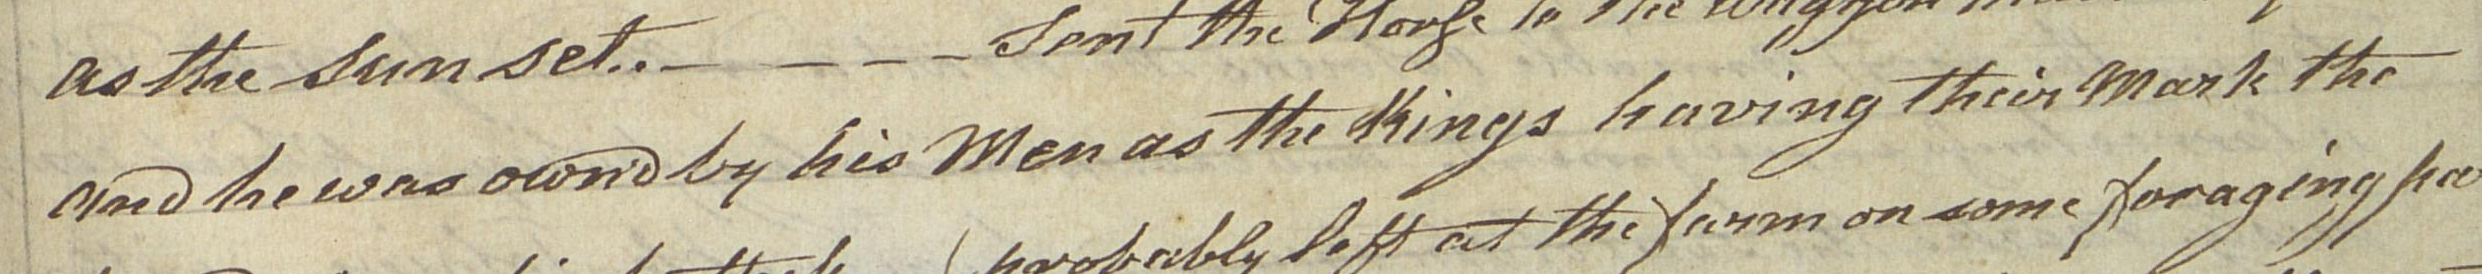and he was own'd by his Men as the kings having their Mark the
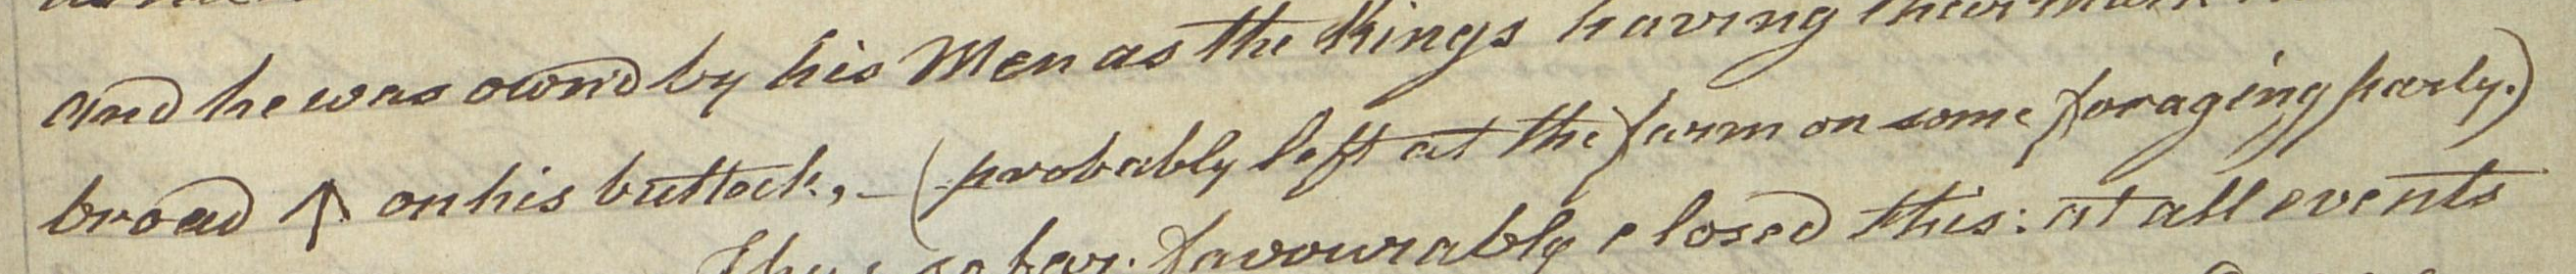broad [_] on his buttock, (probably left at the farm on some foraging party.)
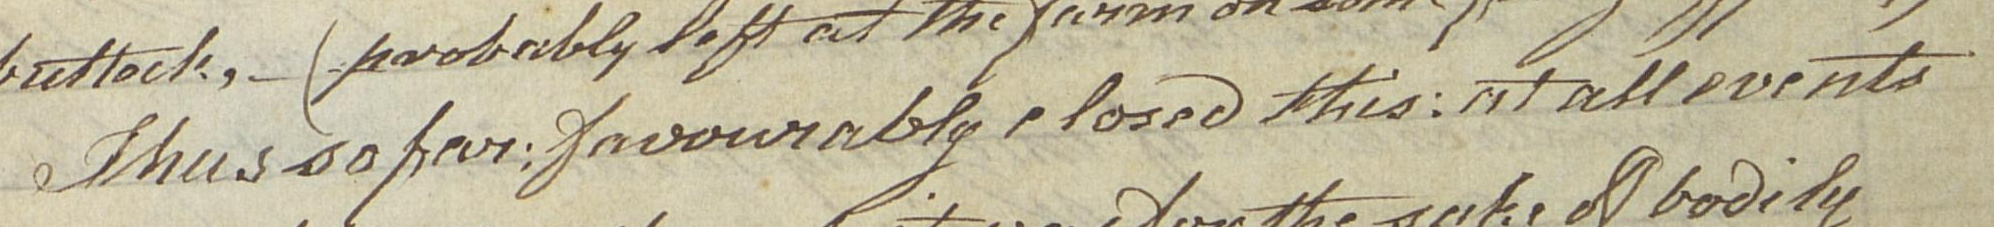Thus so for: favourably closed this: at all events
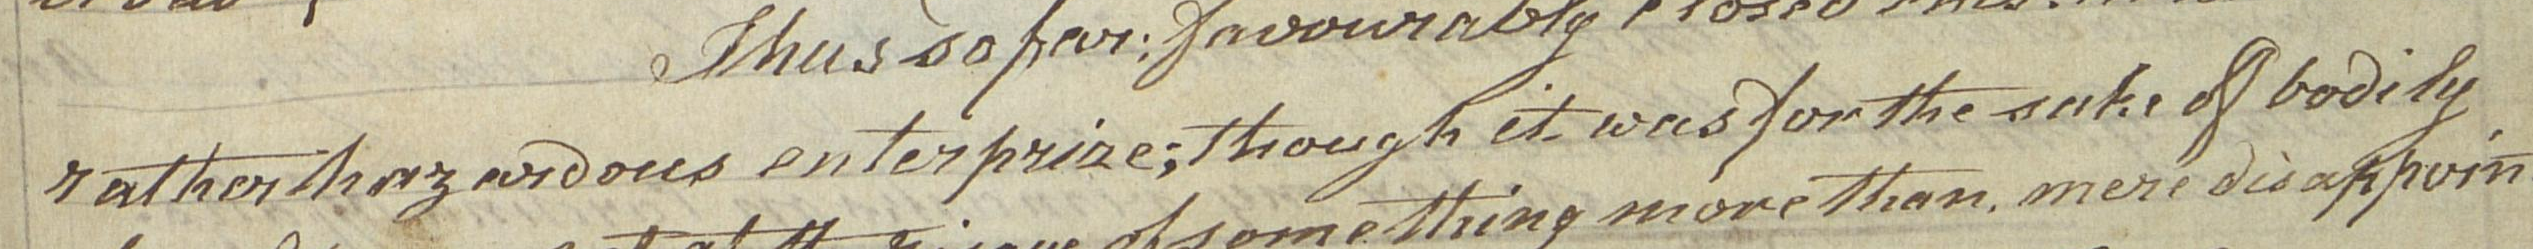rather hazardous enterprise; though it was for the sake of bodily
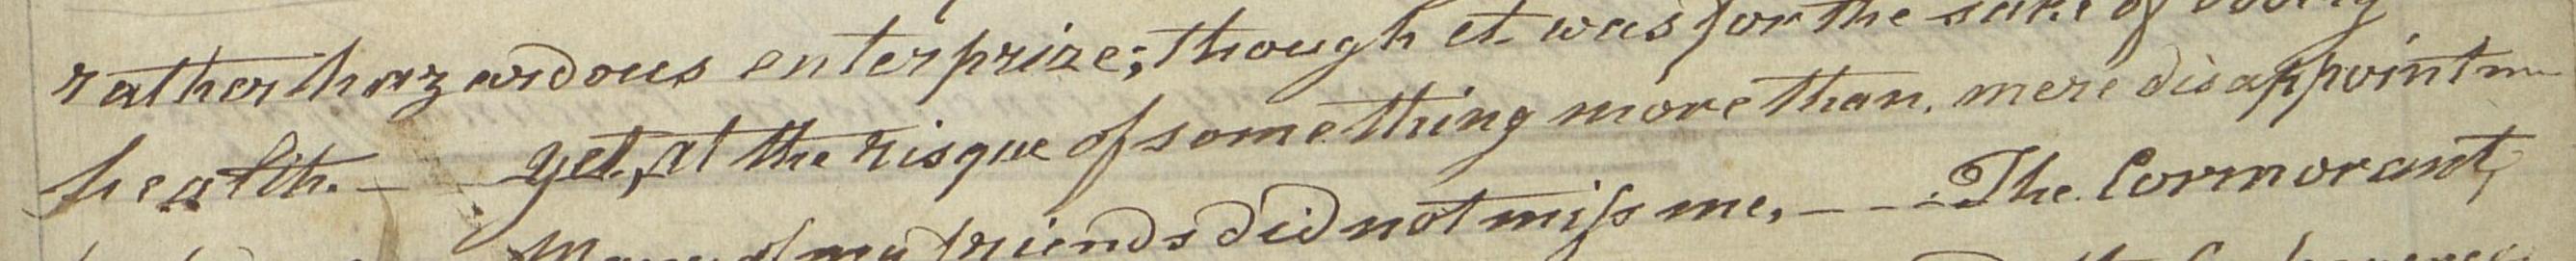health. yet at the risque of something more than mere disappointm
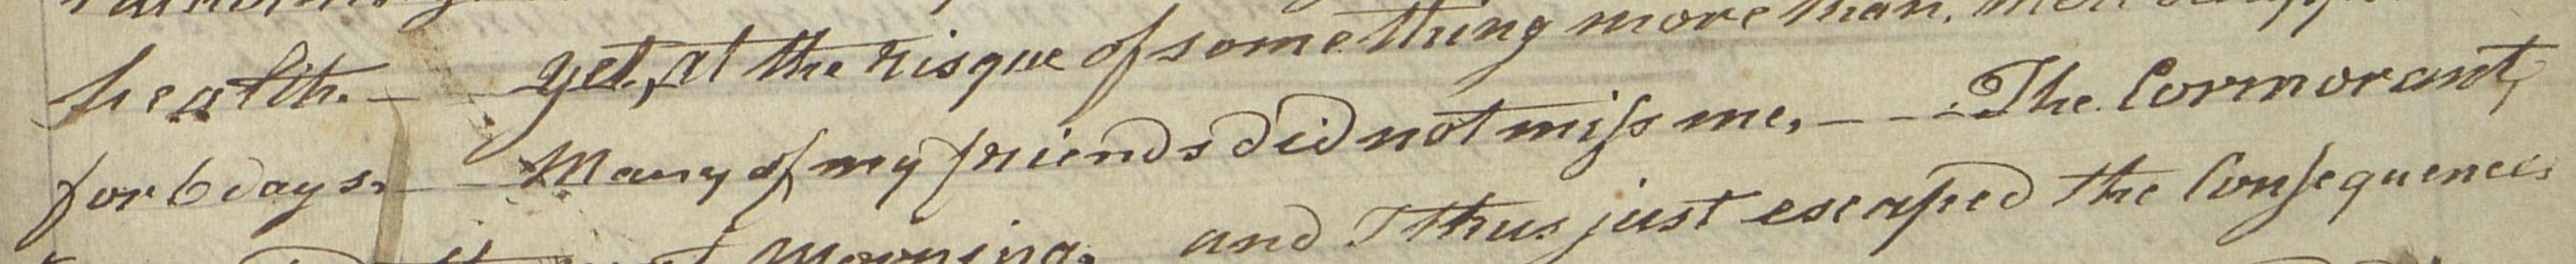for 6 days, Many of my friends did not miss me, The Cormorant
